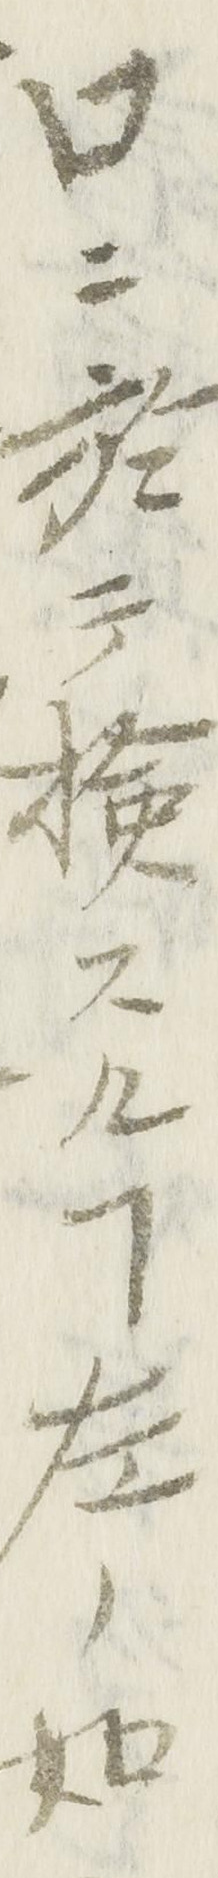口ニ於テ検スルニ左ノ如シ
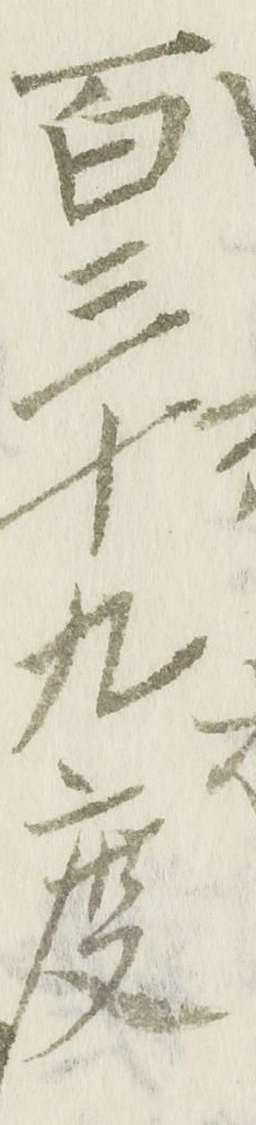百三十九度
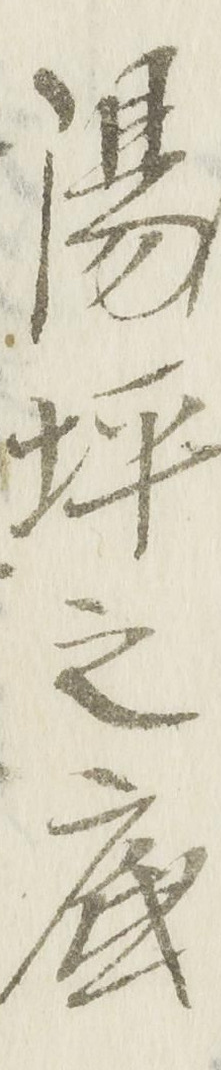湯坪之底

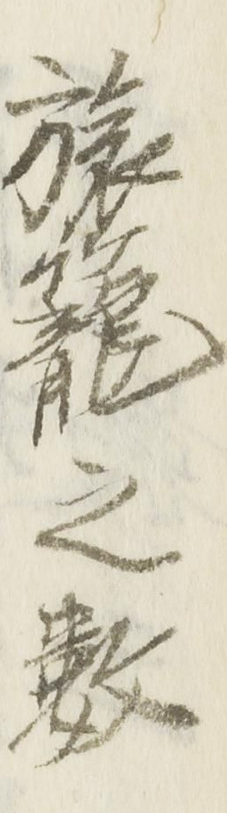旅籠之数
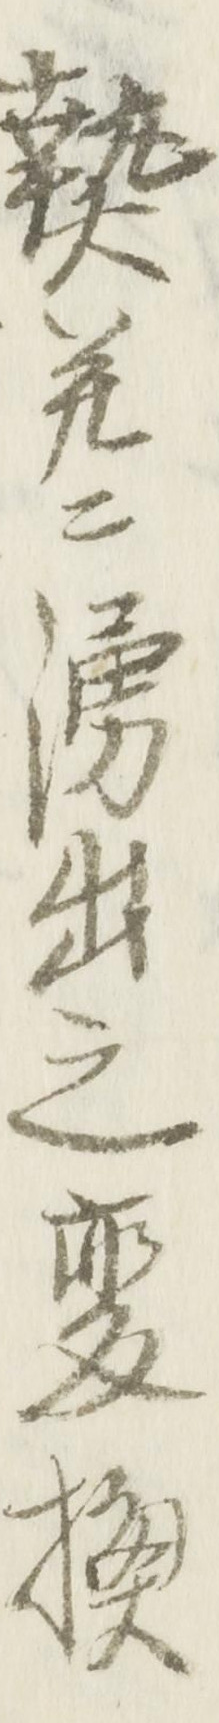熱并ニ湧出之変換
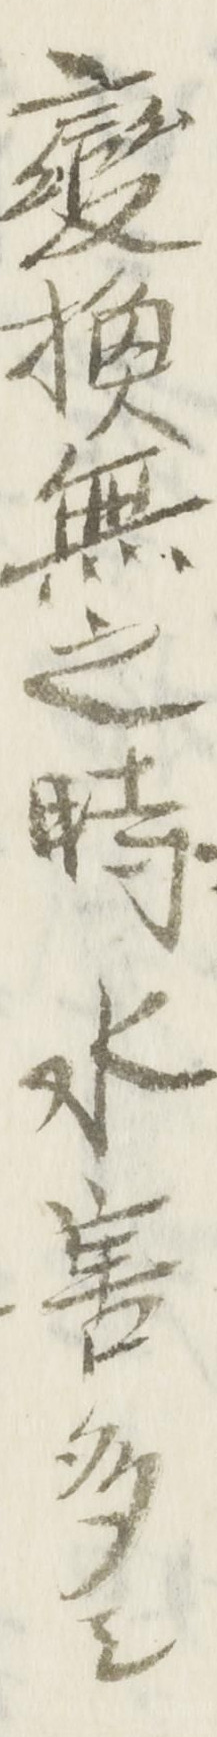変換無之時水害多シ
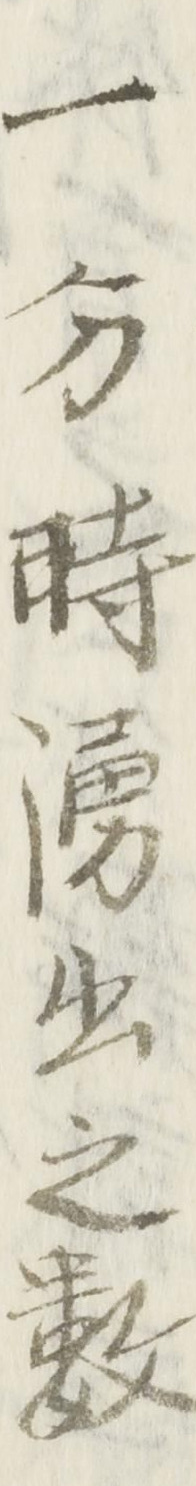一分時湧出之数
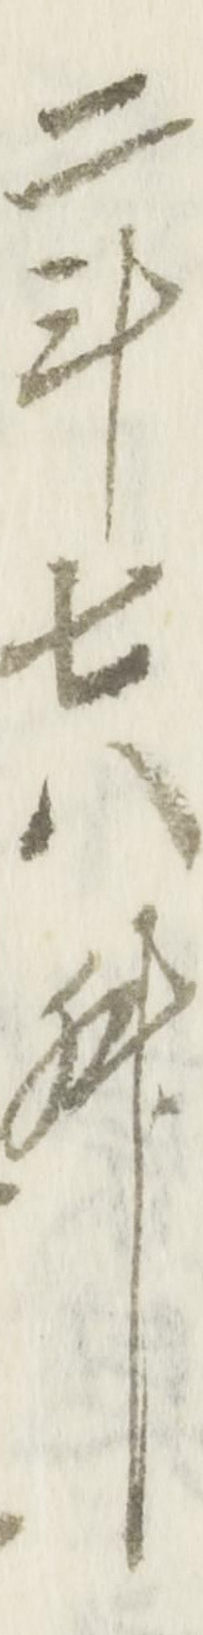二斗七八升
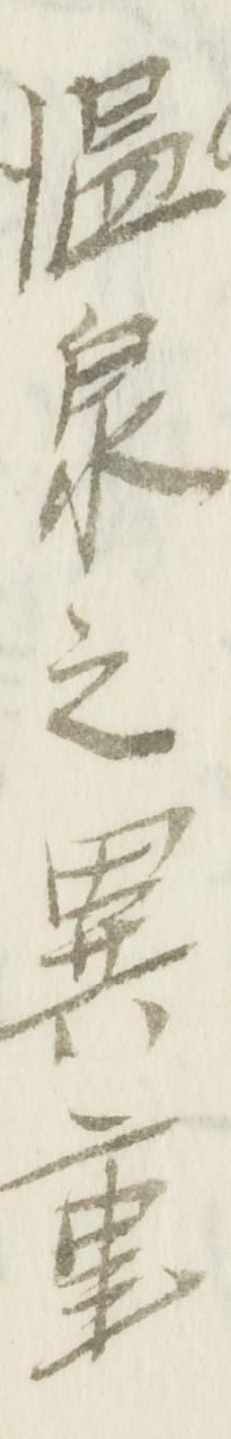温泉之異重
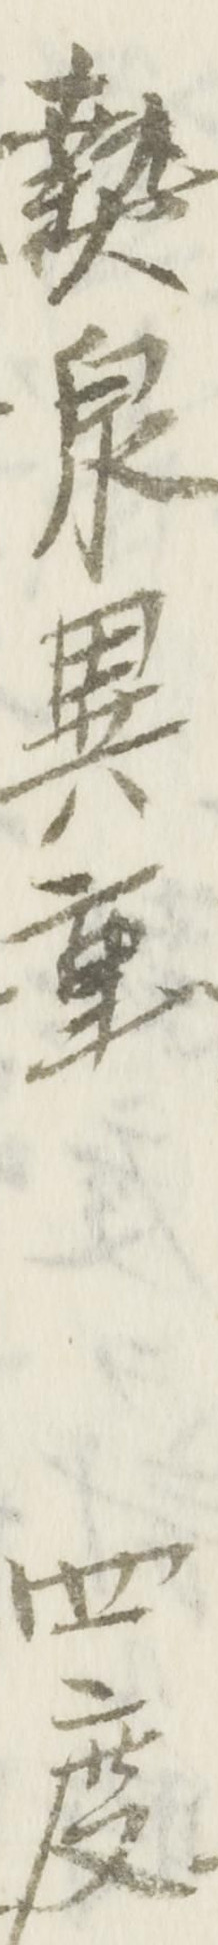熱泉異重四度
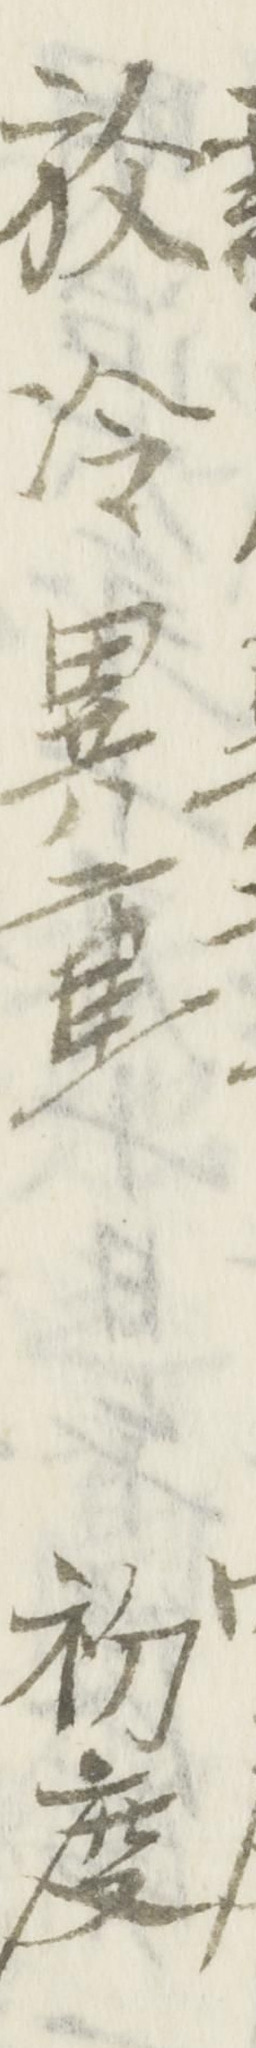放冷異重初度
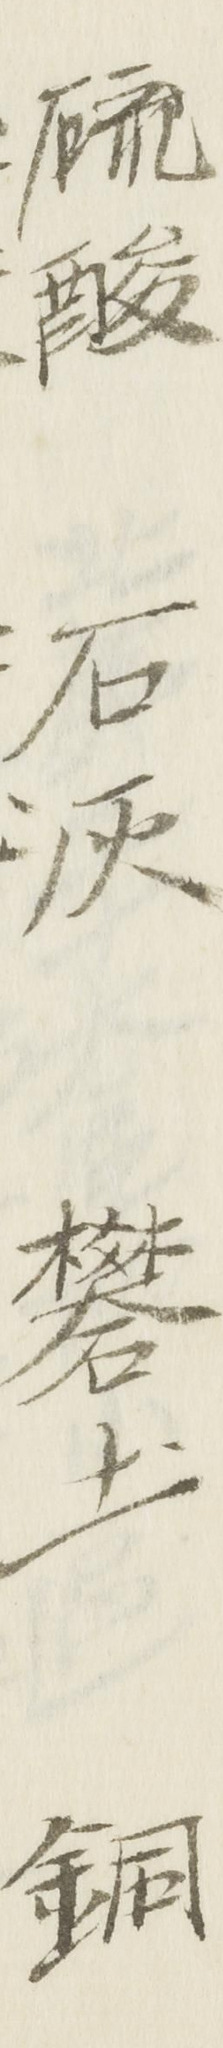硫酸石灰礬土銅
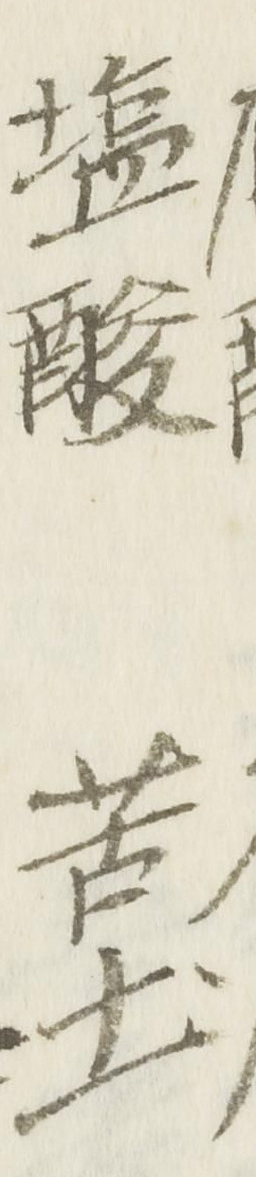塩酸苦土
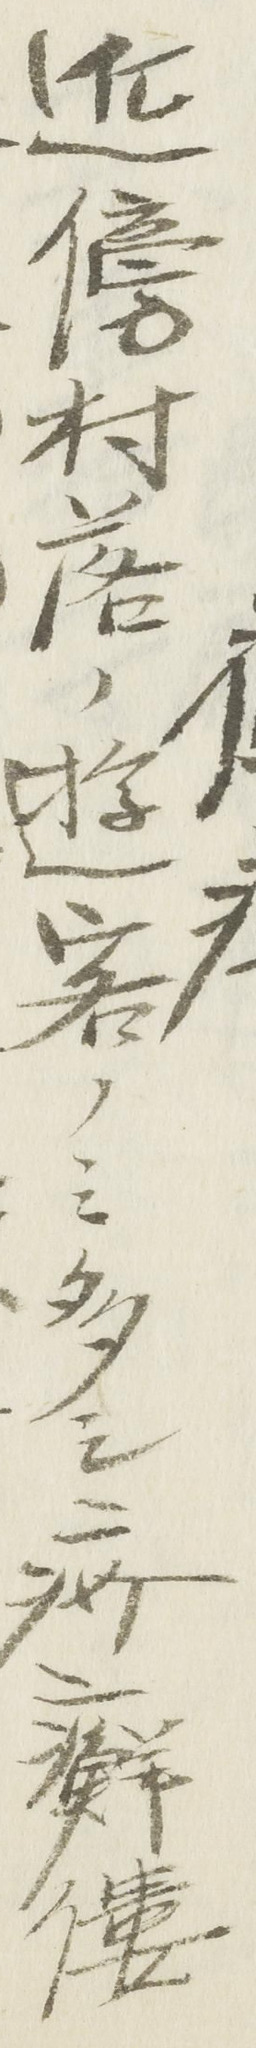近傍村落ノ遊客ノミ多シ疥癬庄僂
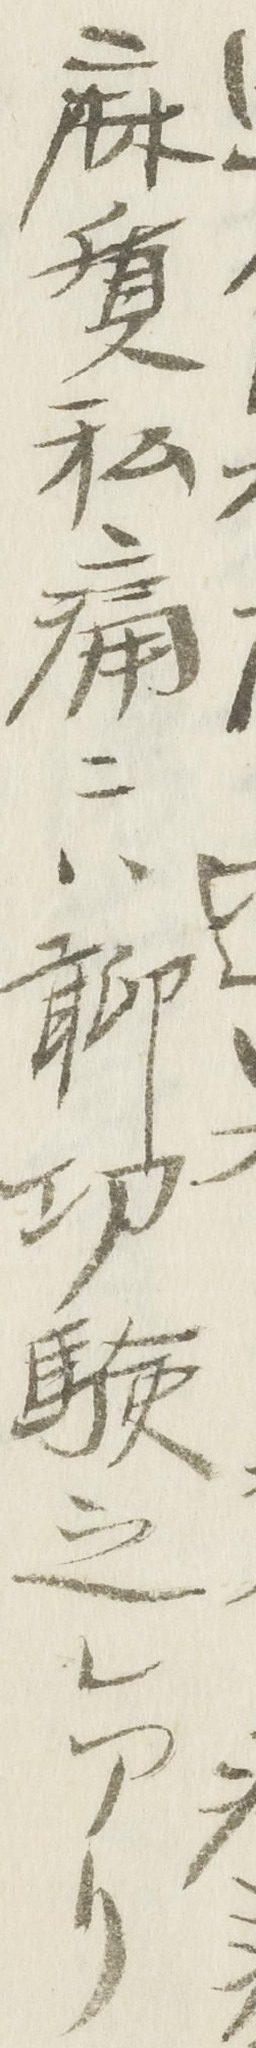麻質私痛ニハ聊功験之レアリ

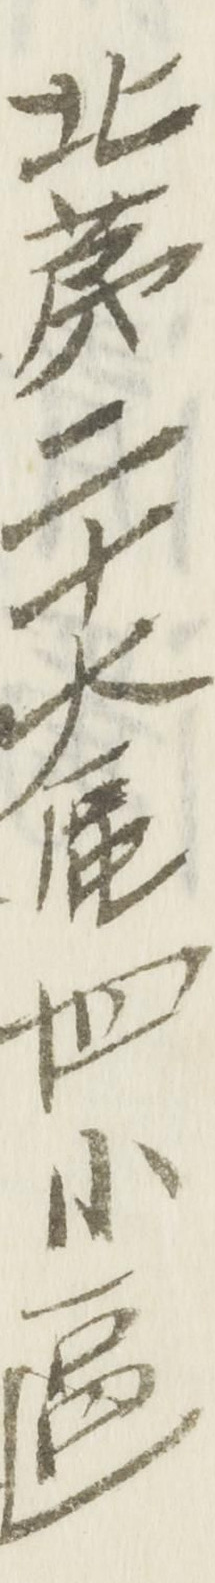北第二十大区四小区
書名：温冷泉試験表
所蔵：東京大学地震研究所図書室 Earthquake Research Institute Library, The University of Tokyo, JAPAN
